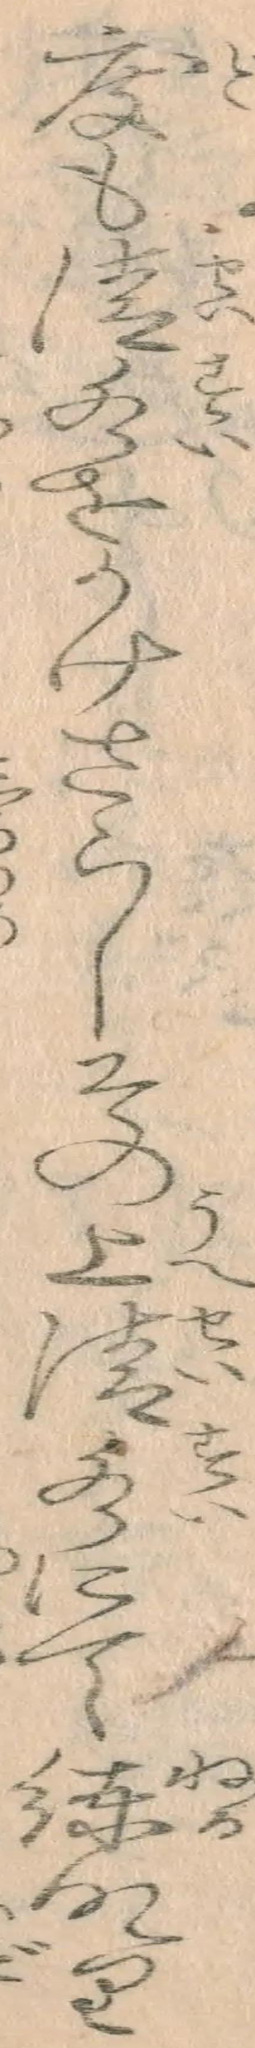度も清水をかけさらしその上清水にて煉なり
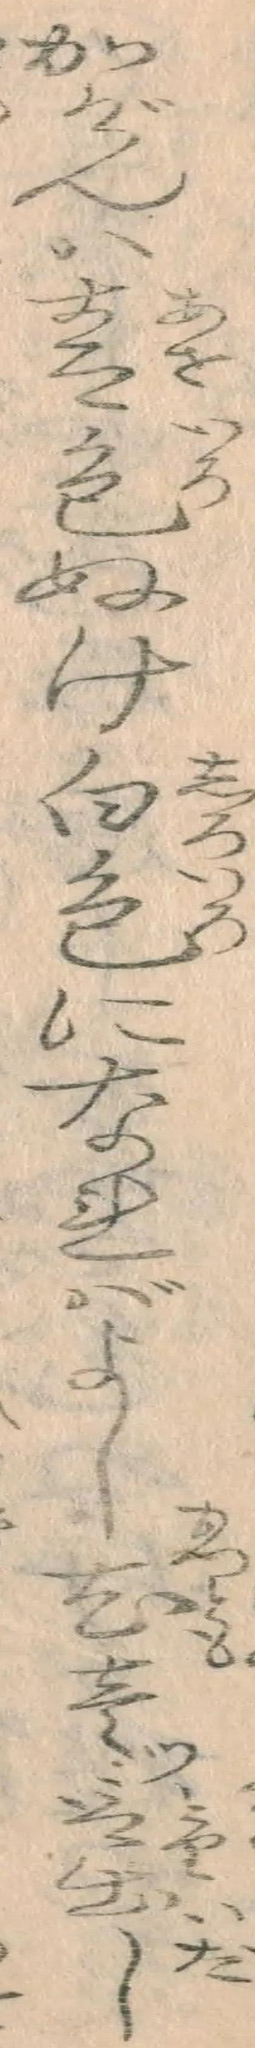かげんは青色ぬけ白色になればよし尤壱ツ取出し
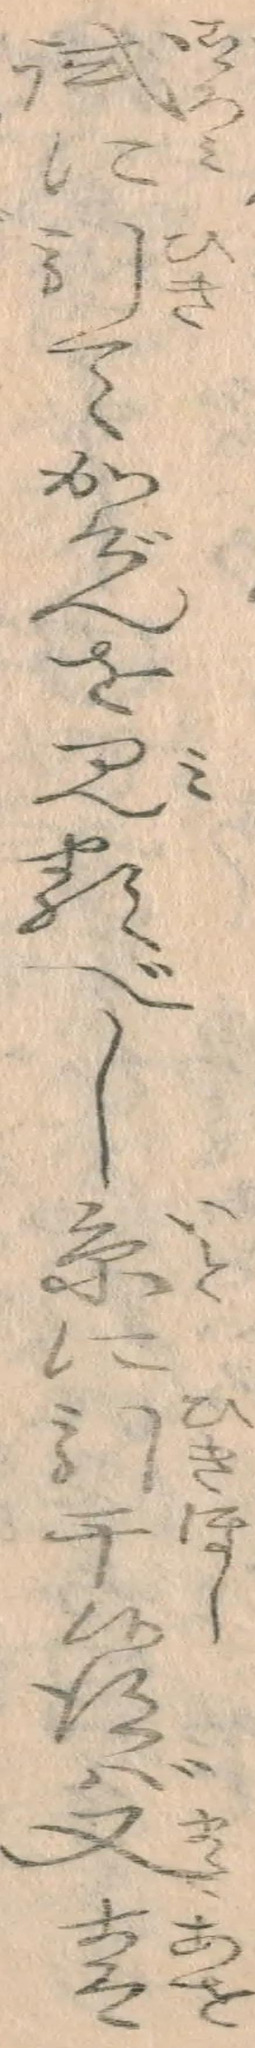試に引てかげんを見るべし糸に引干候得ば又青
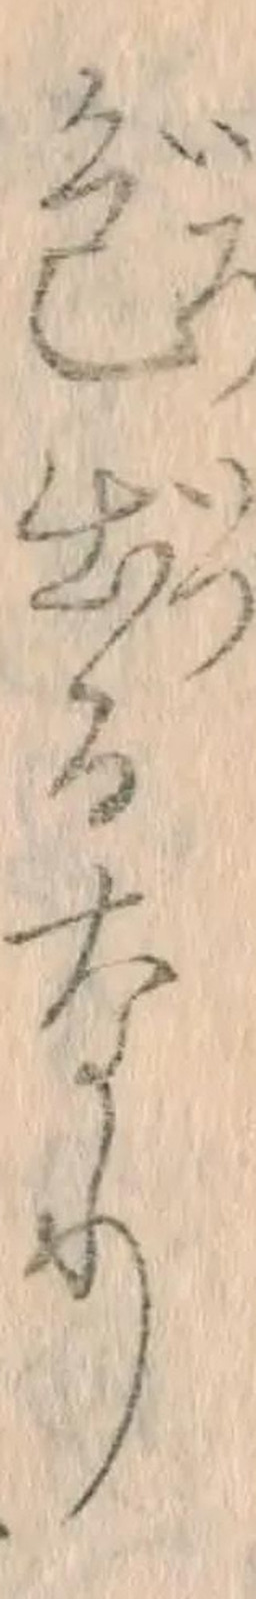色出るなり
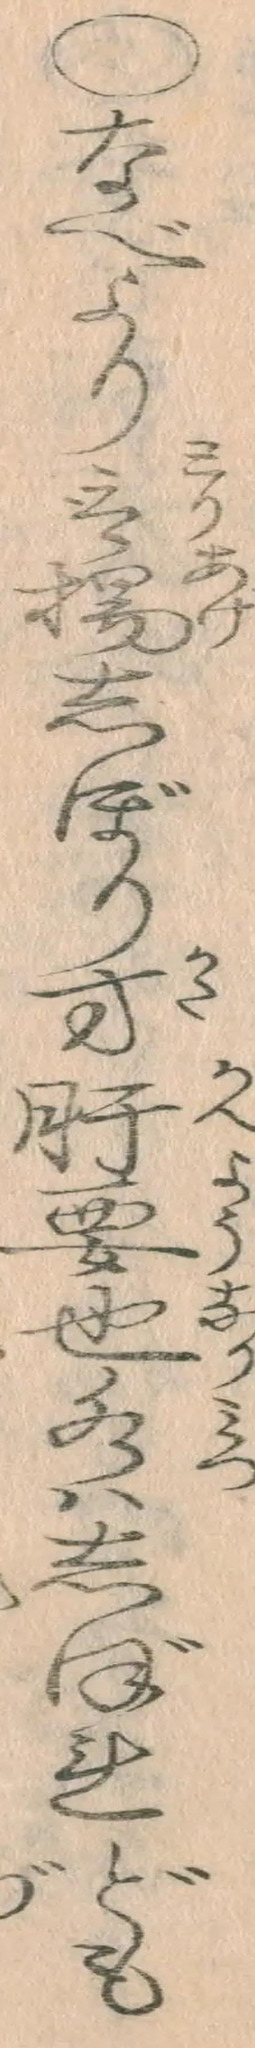○なべより取揚しぼり方肝要也水はしぼれども
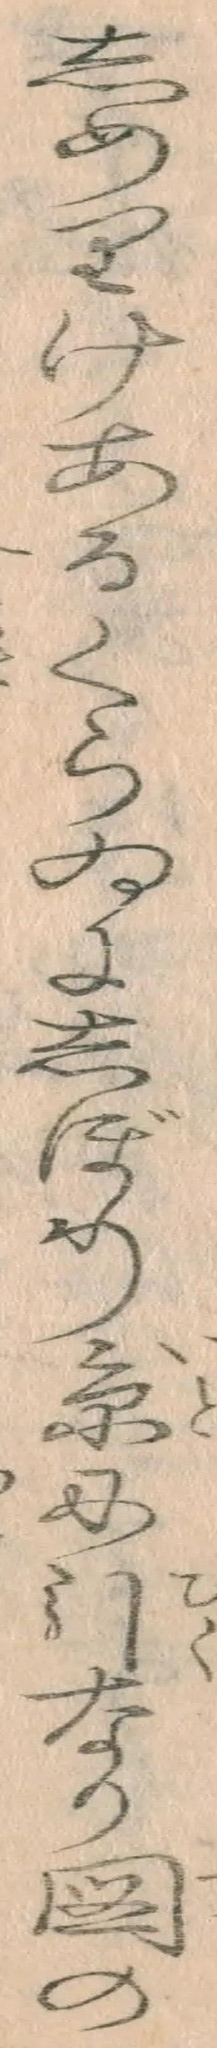しめりけあるくらゐにしぼり糸に引なり図の
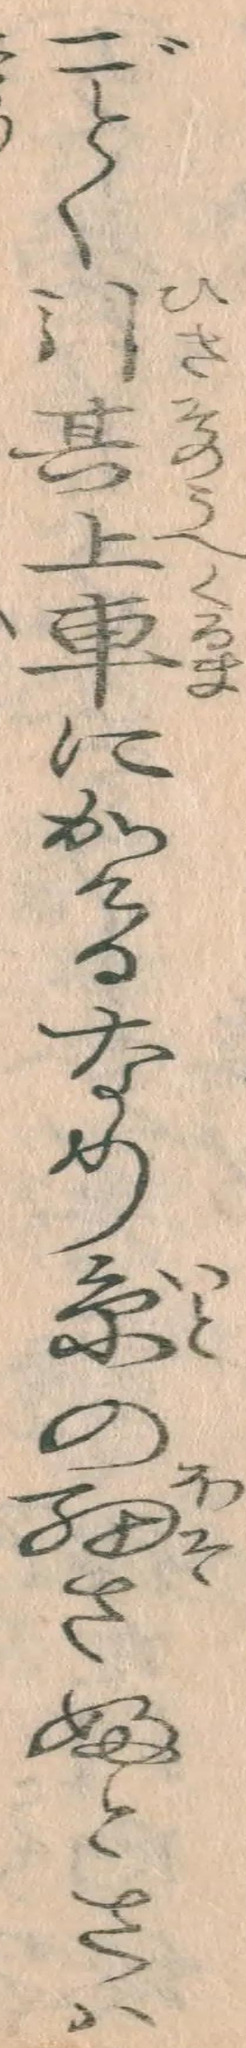ごとく引其上車にかけるなり糸の細さふとさは
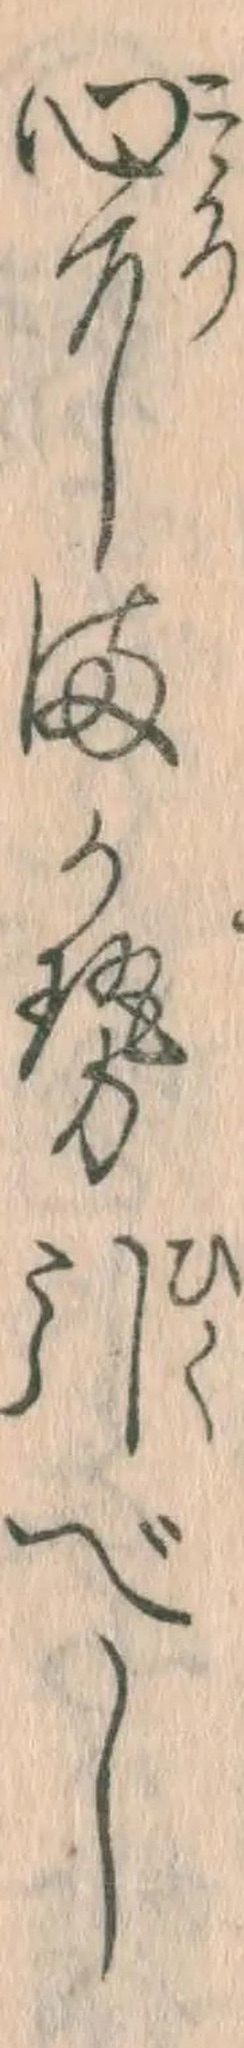心にまかせ引べし
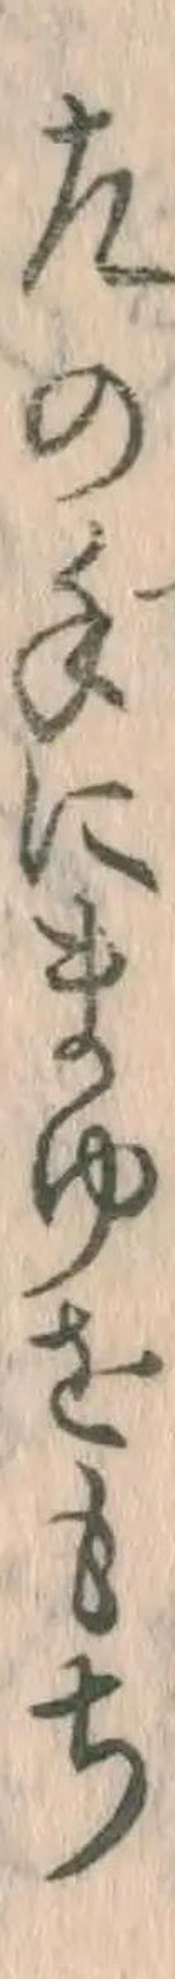左の手にまゆをもち
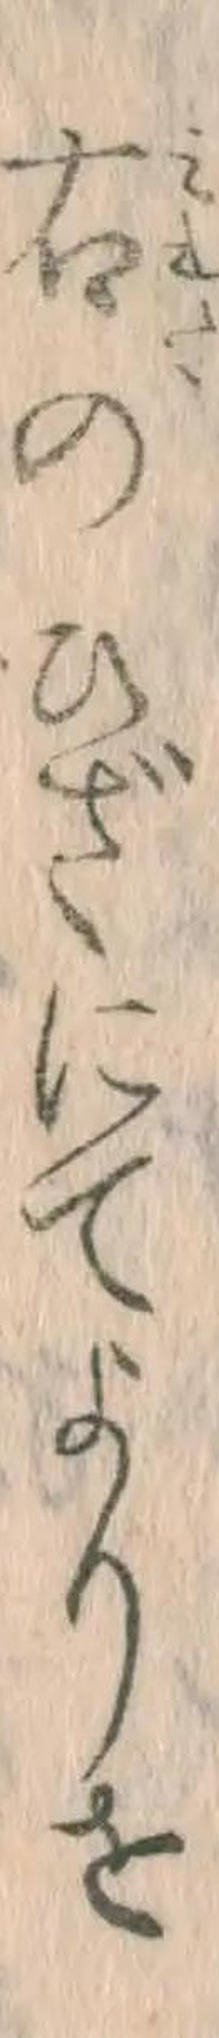右のひざにてよりを
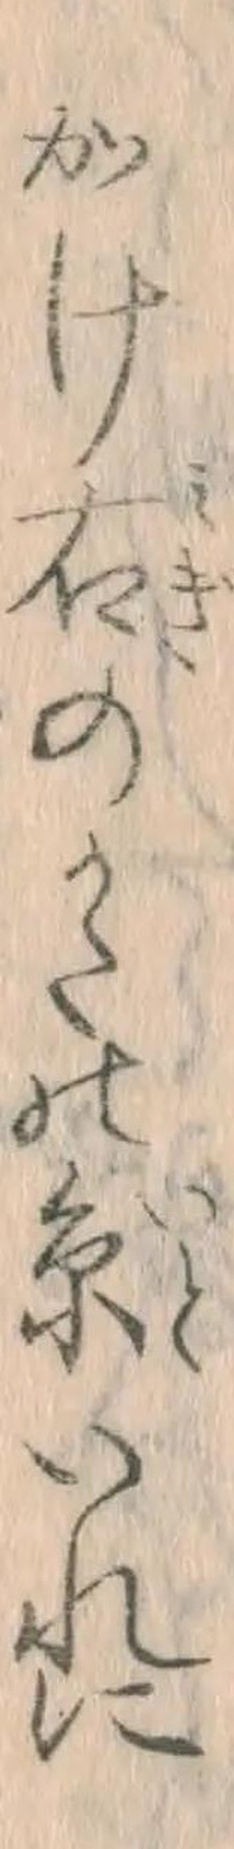かけ右のかたの糸いれに
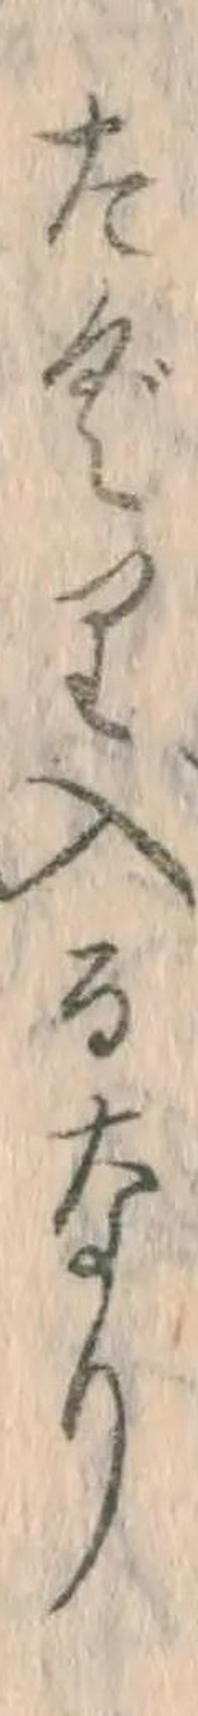たぐり入るなり
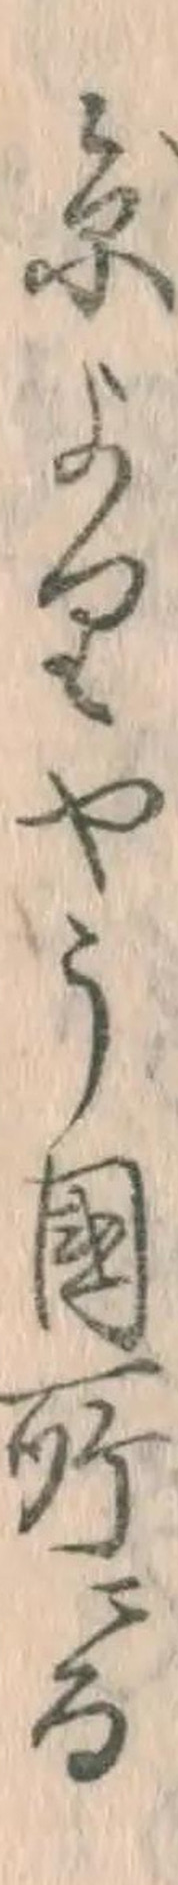糸よりやう国所にて
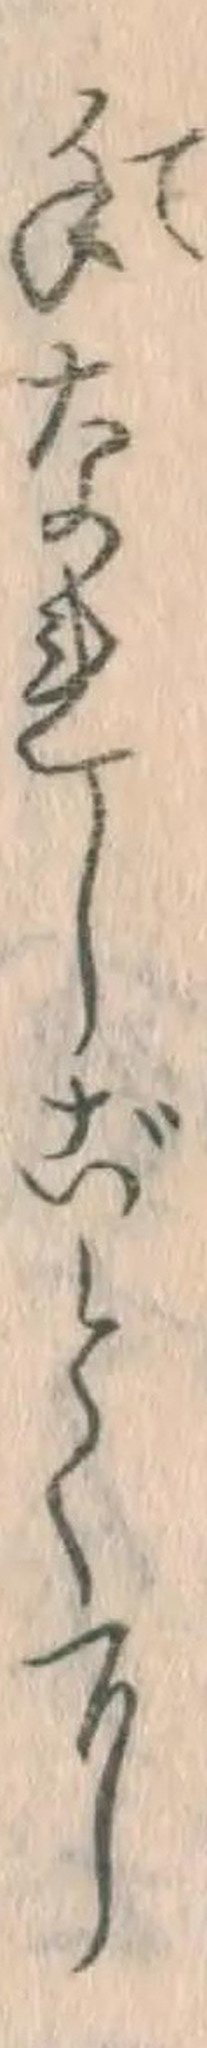手なれしごとくに
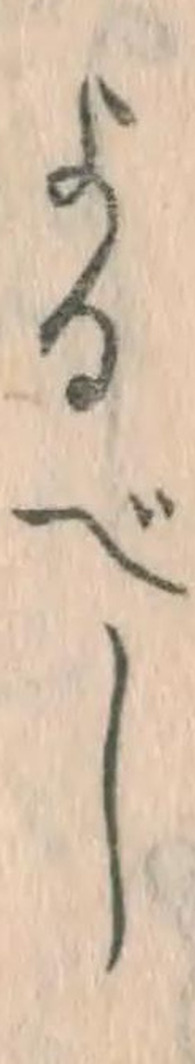よるべし

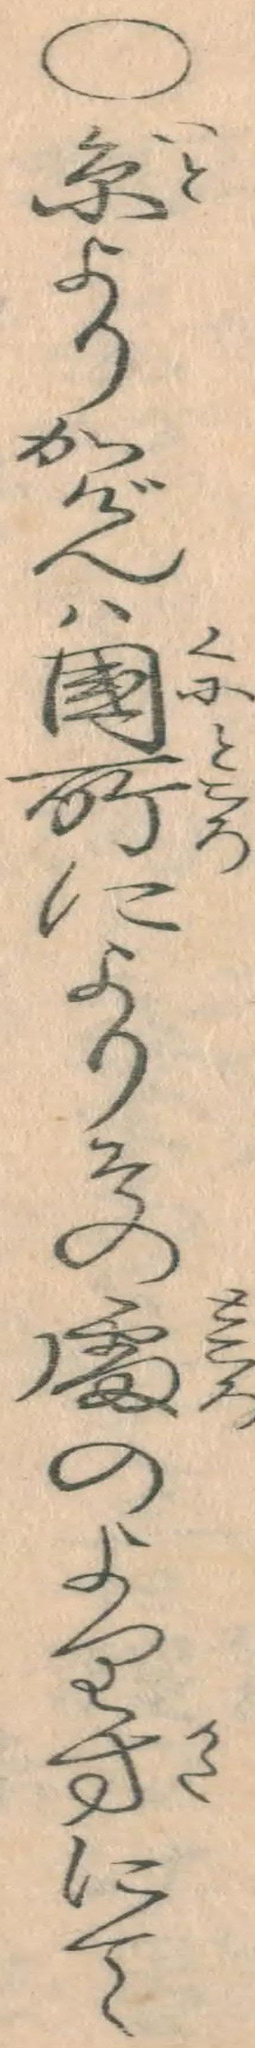○糸よりかげんは国所によりその処のより方にて
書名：山繭養法秘傳抄
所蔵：国立国会図書館 National Diet Library, JAPAN
